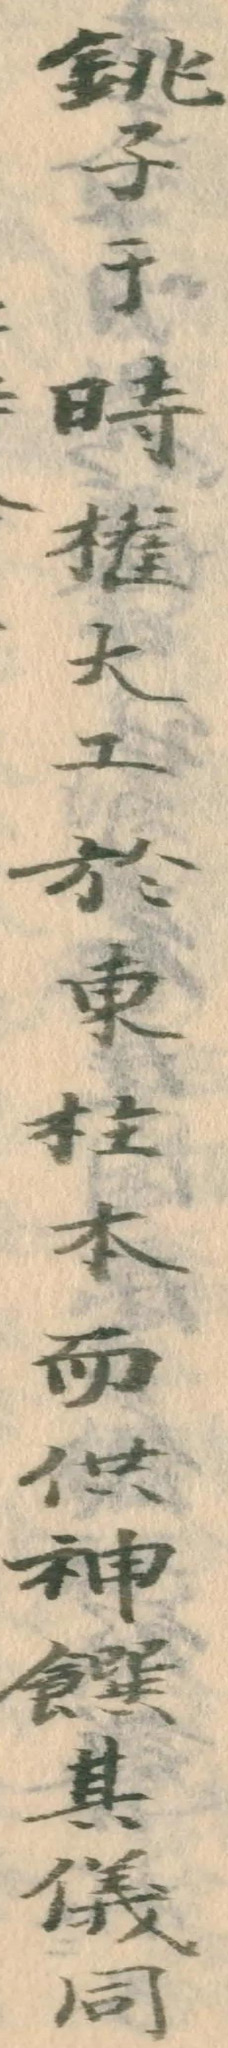銚子于時権大工於東柱本而供神饌其儀同
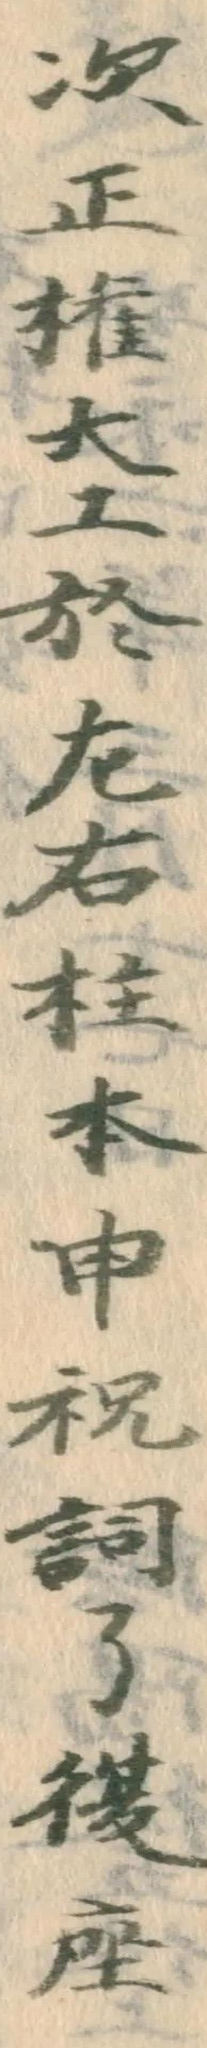次正権大工於左右柱本申祝詞了復座
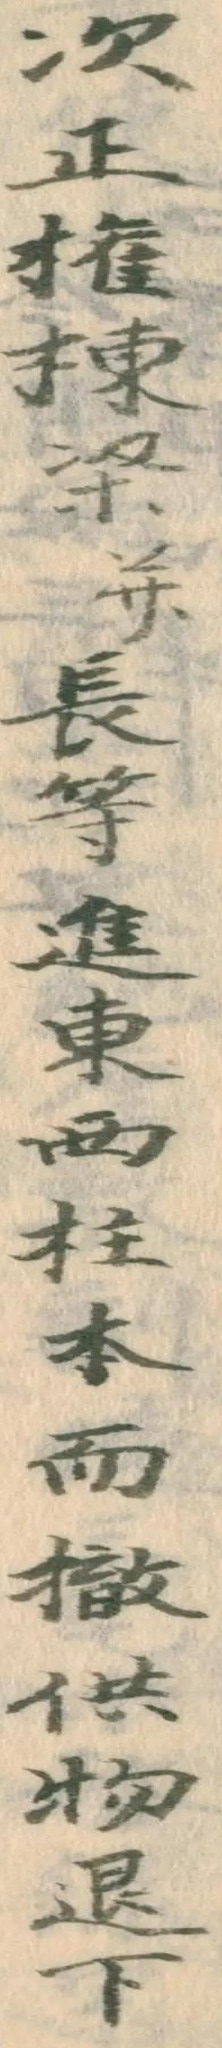次正権棟梁并長等進東西柱本而撤供物退下
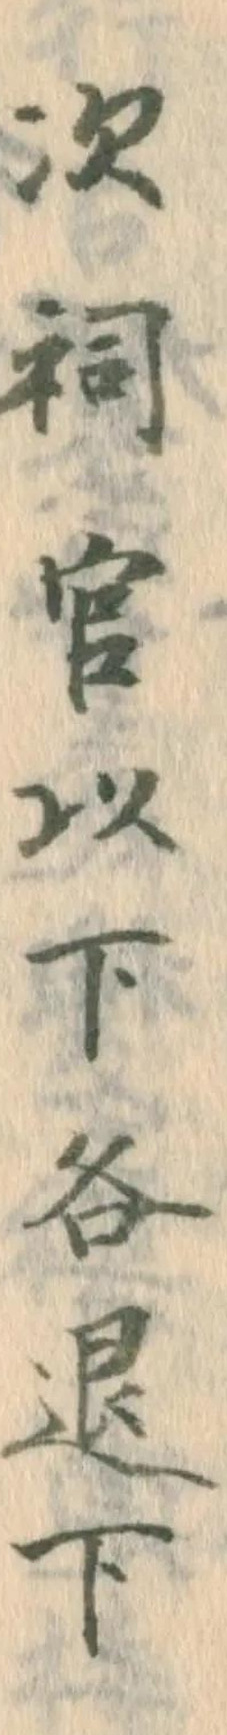次祠官以下各退下
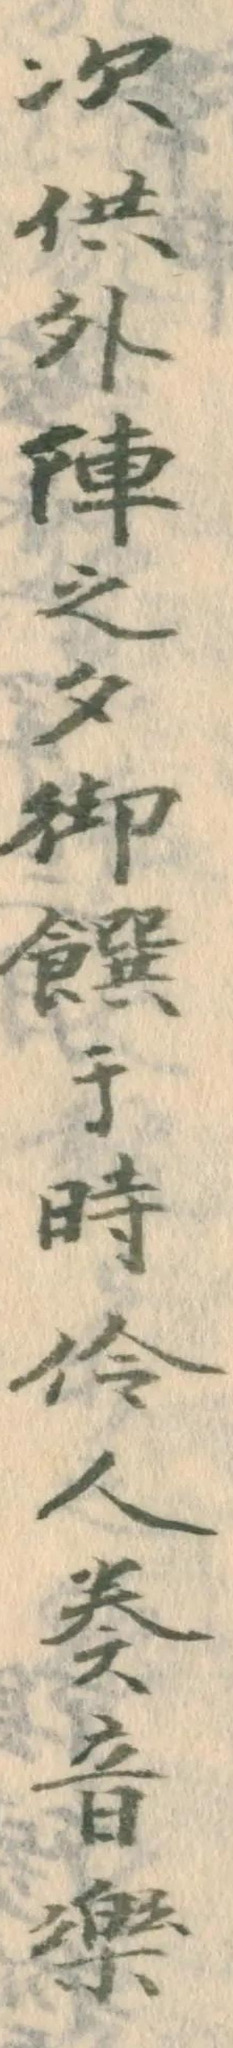次供外陣之夕御饌于時伶人奏音楽
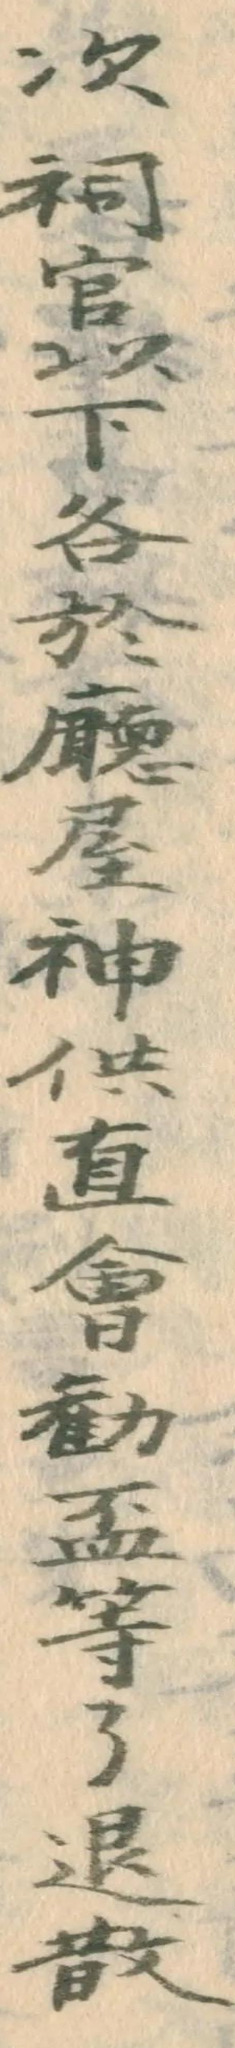次祠官以下各於庁屋神供直会勧盃等了退散
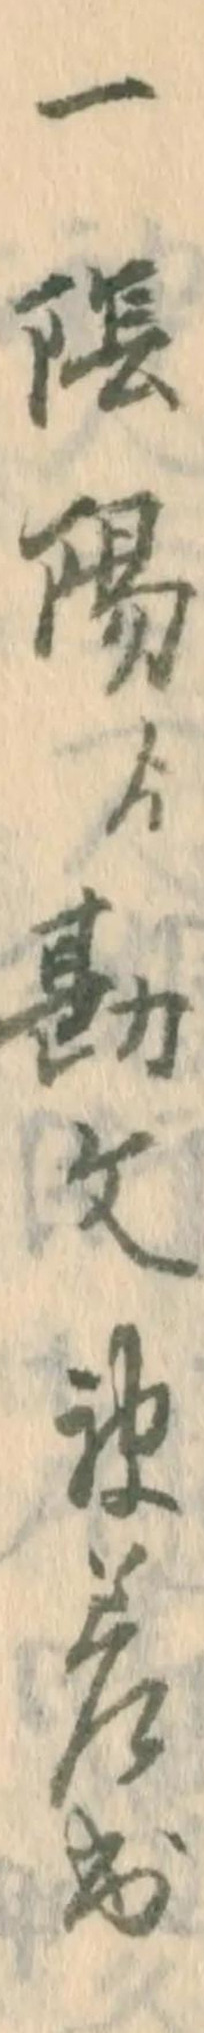一陰陽ゟ勘文被差出

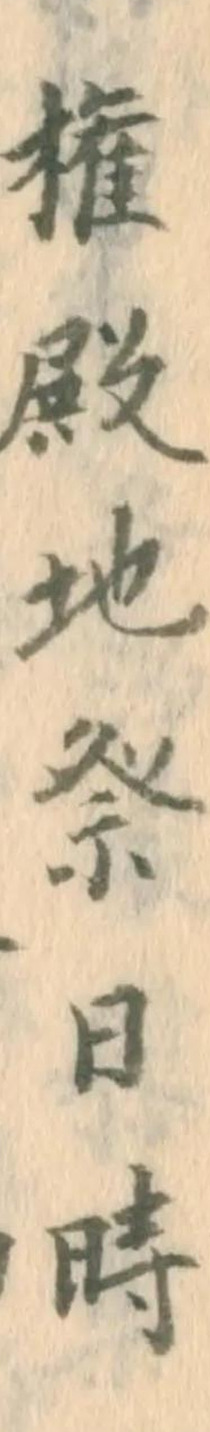権殿地祭日時
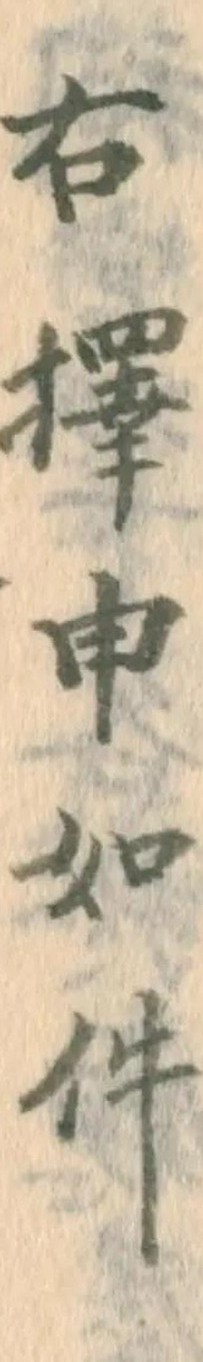右択申如件
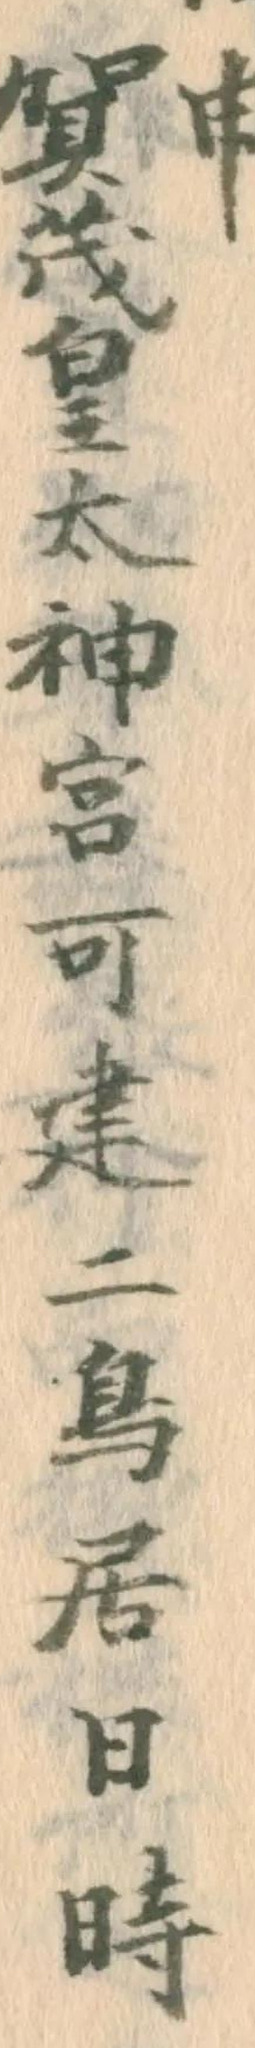賀茂皇太神宮可建二鳥居日時
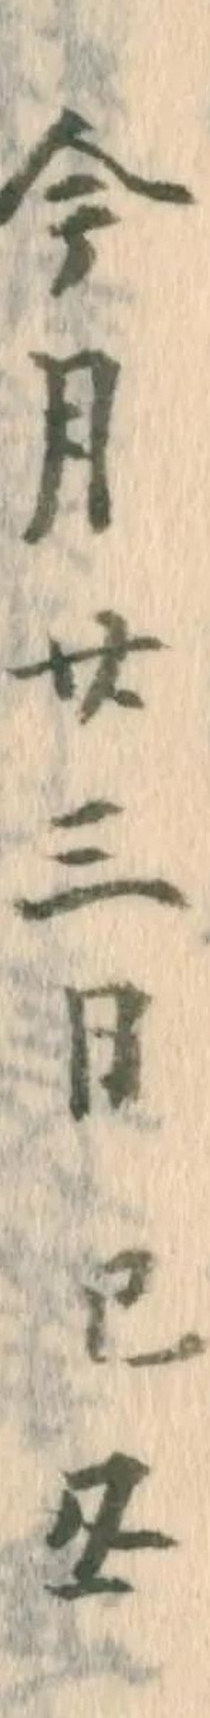今月廿三日己丑
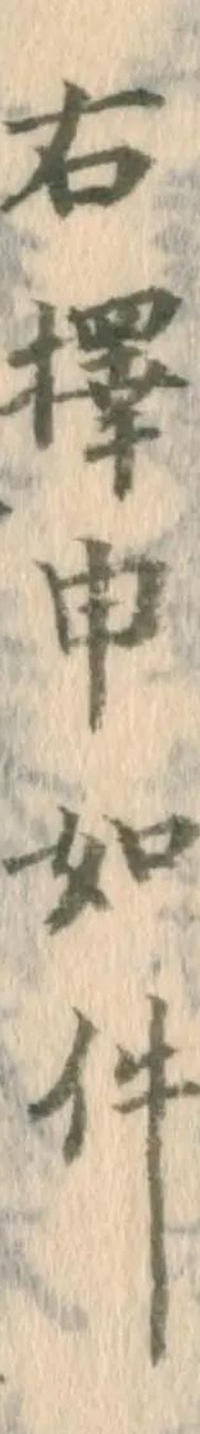右択申如件
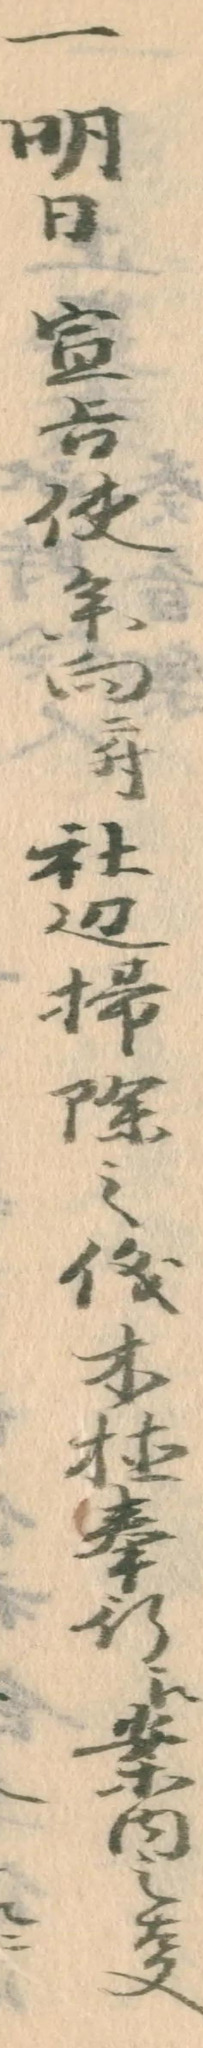一明日宣旨使参向ニ付社辺掃除之儀木植奉行江案内之事
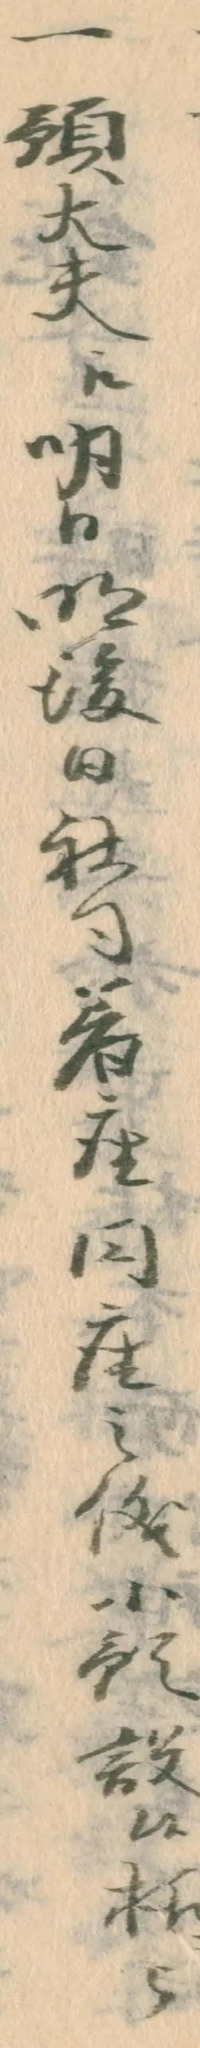一預大夫江明日明後日社司着座同座之儀小預設候様ニ被
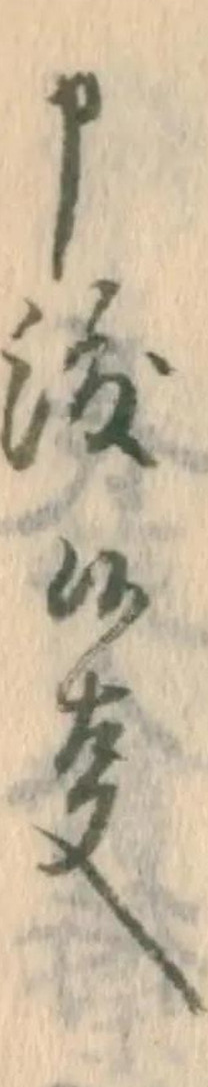申渡候事
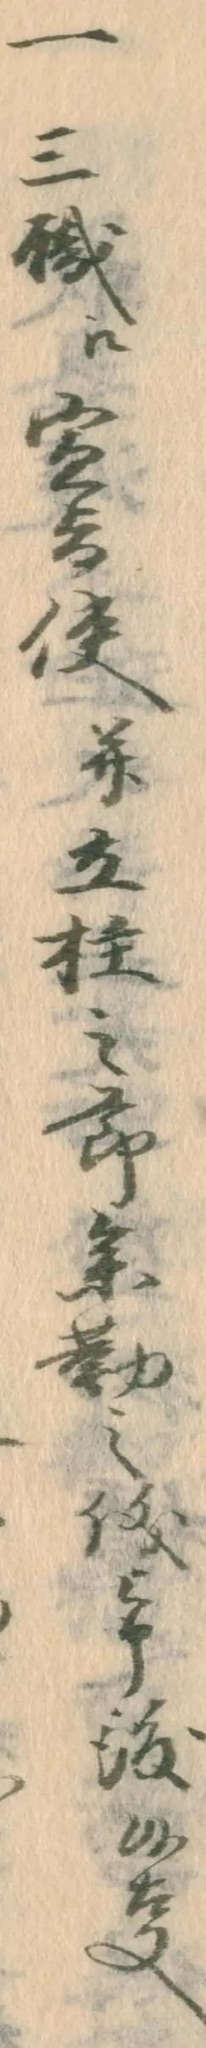一三職江宣旨使并立柱之節参勤之儀被申渡候事
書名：賀茂社記録. 第17冊
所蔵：国立国会図書館 National Diet Library, JAPAN
